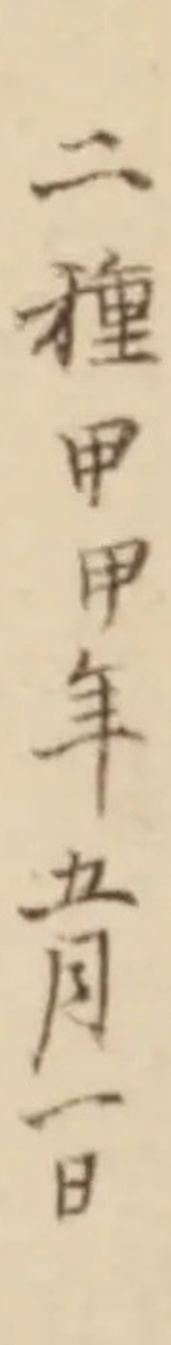二種甲申年五月一日
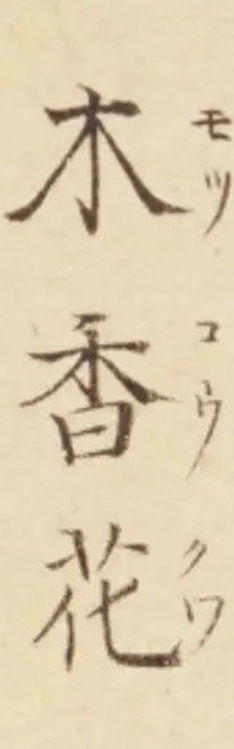木香花

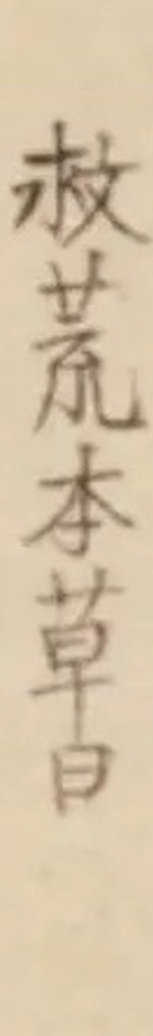救荒本草曰
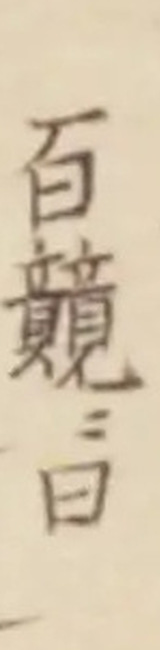百競に曰
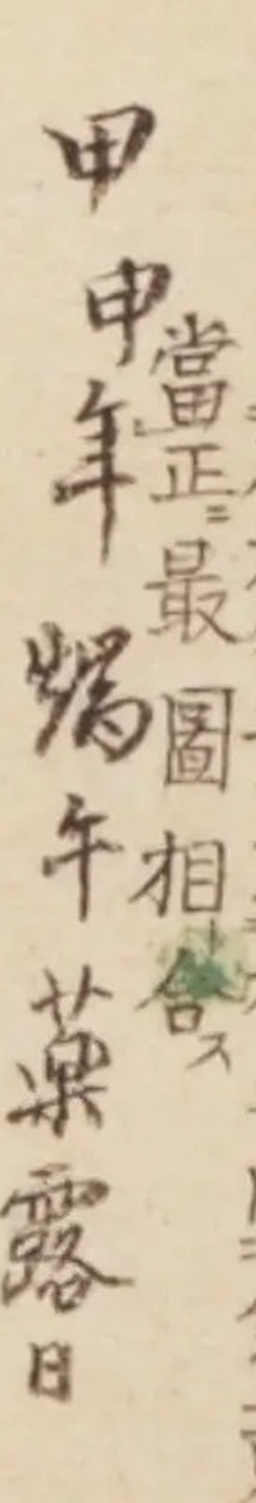甲申端午薬露日
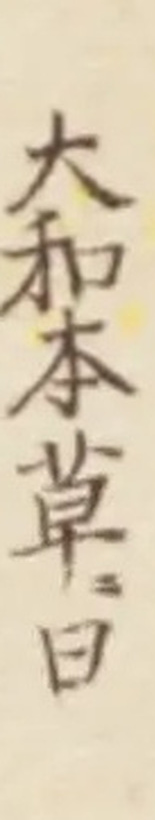大和本草に曰
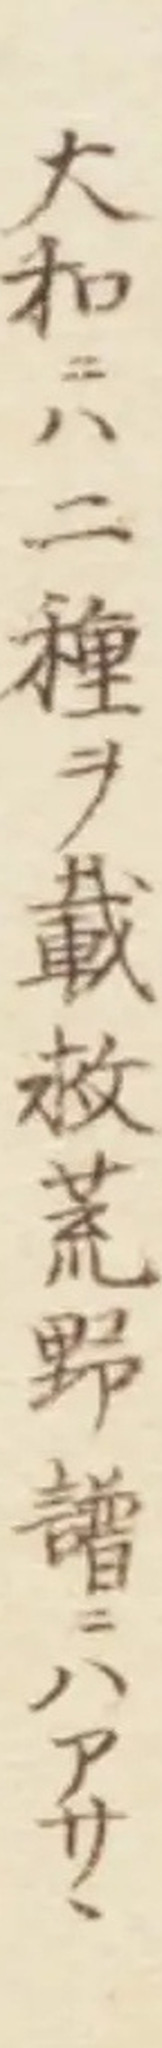大和には二種を載せ救荒野譜じにはあさヽ
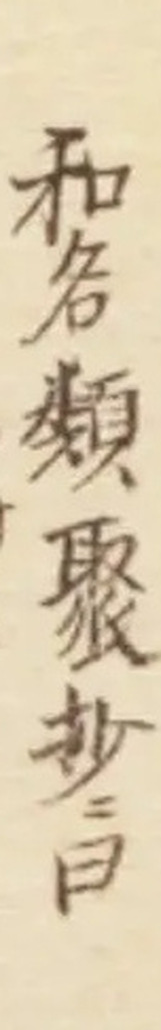和名類聚抄ニ曰
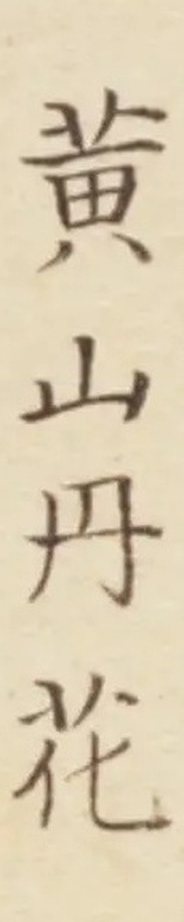黄山丹花
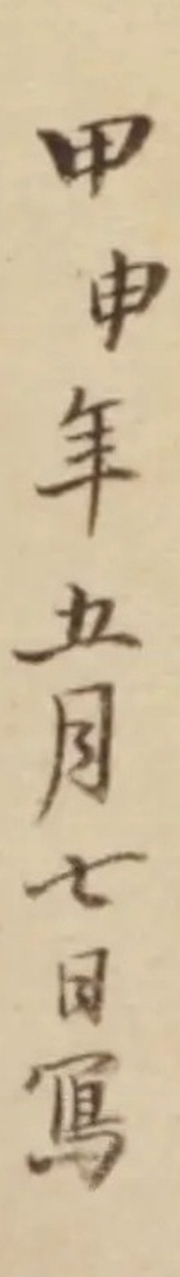甲申年五月七日寫

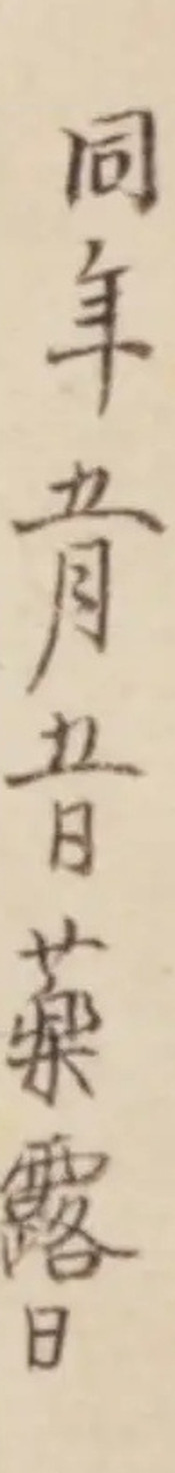同年五月五日藥露日
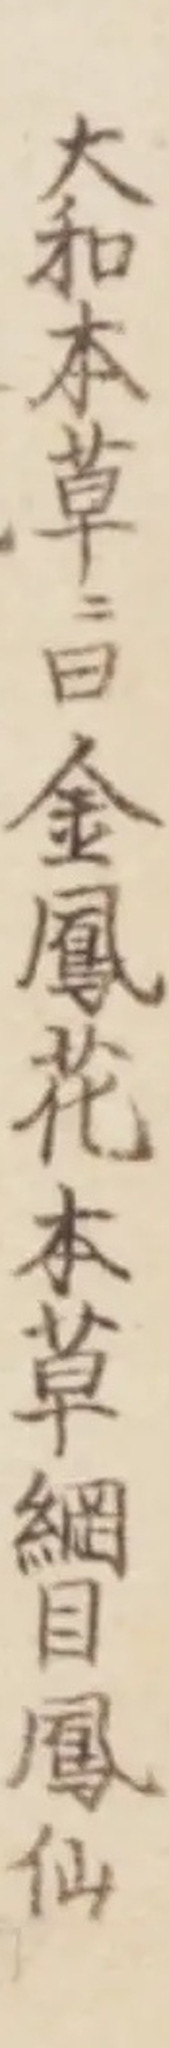金鳳花大和本草に金鳳花本草綱目鳳仙
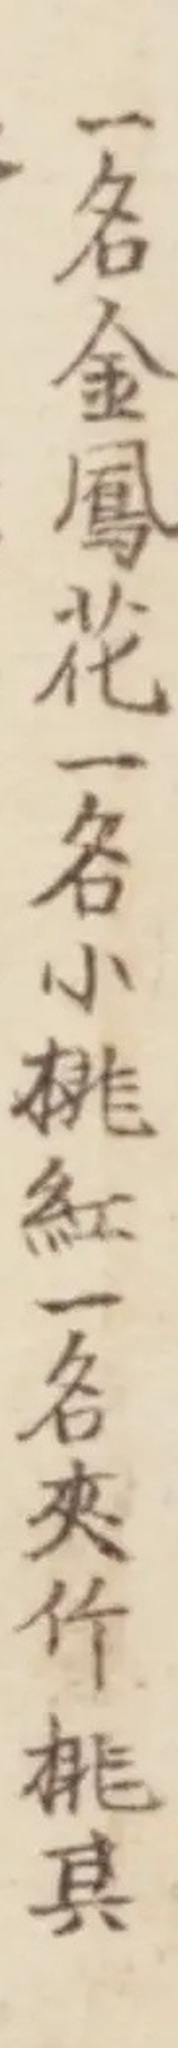一名金鳳花一名小棑紅一名夾竹棑其
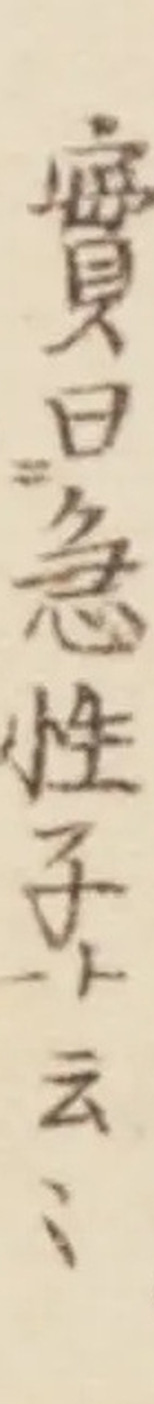實曰急性子と云々
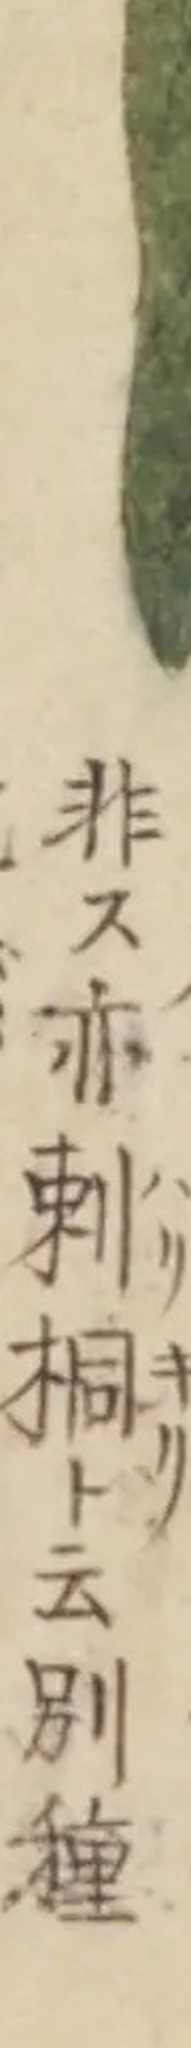非す亦刺桐と云別種
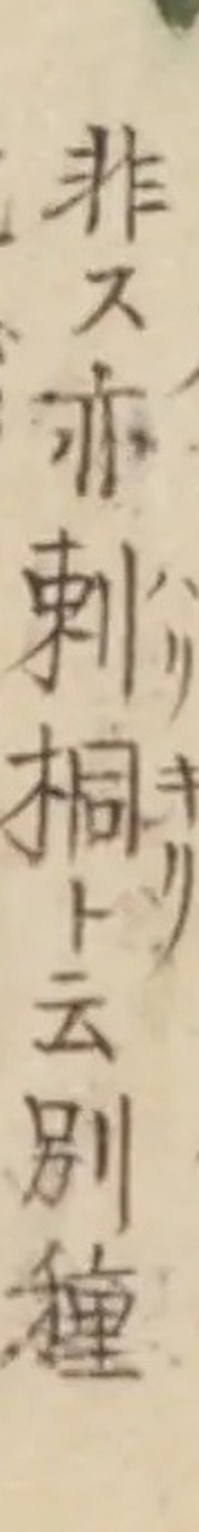非す亦刺桐と云別種
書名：梅園草木花譜夏之部. 2
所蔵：国立国会図書館 National Diet Library, JAPAN
